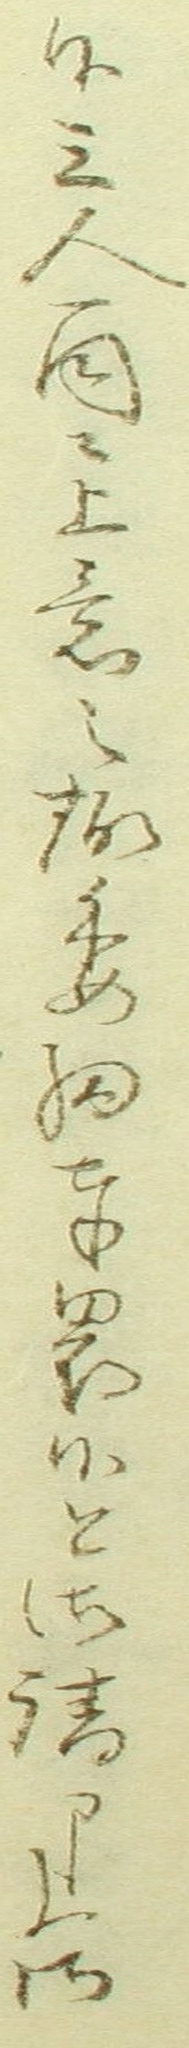候三人一同に上意之趣委細奉畏候と御請申上御
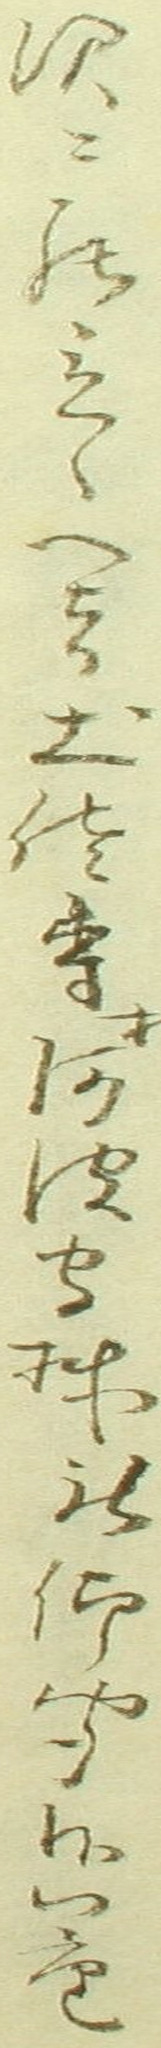沢に罷立候へ者土佐守様阿波守様被仰聞候は重
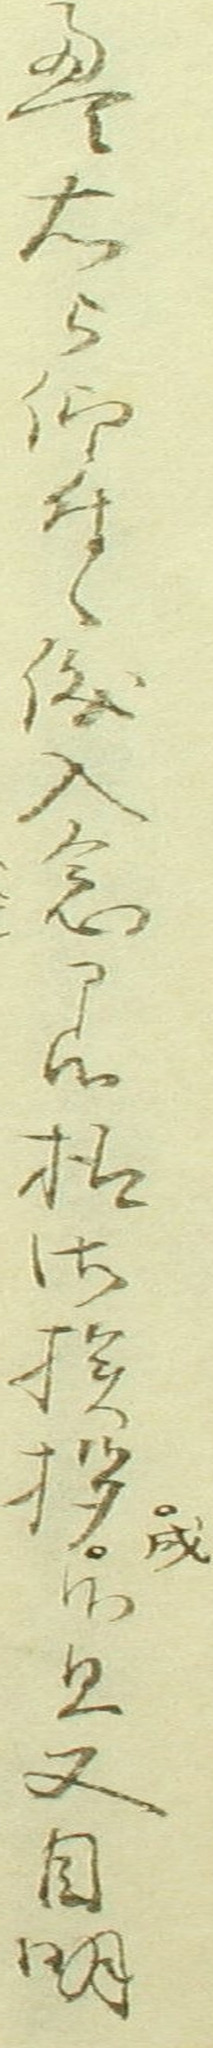畳右被仰付候儀入念申候様挨拶成候且又目明
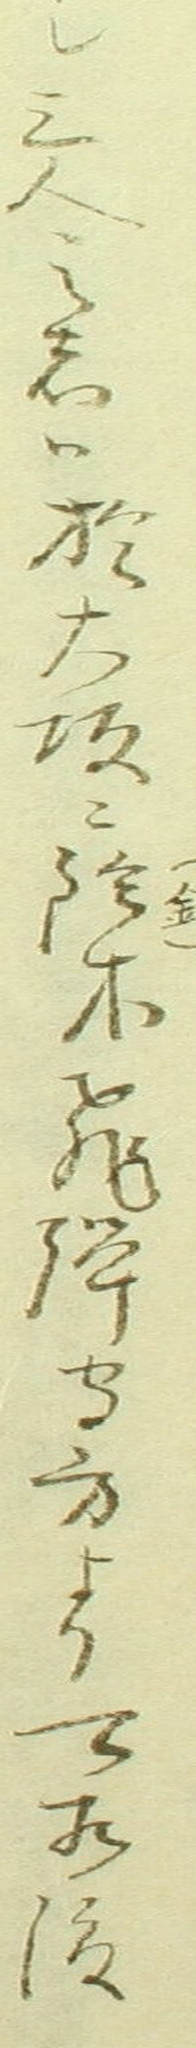し三人之者は於大坂に？木飛騨守方より可相渡
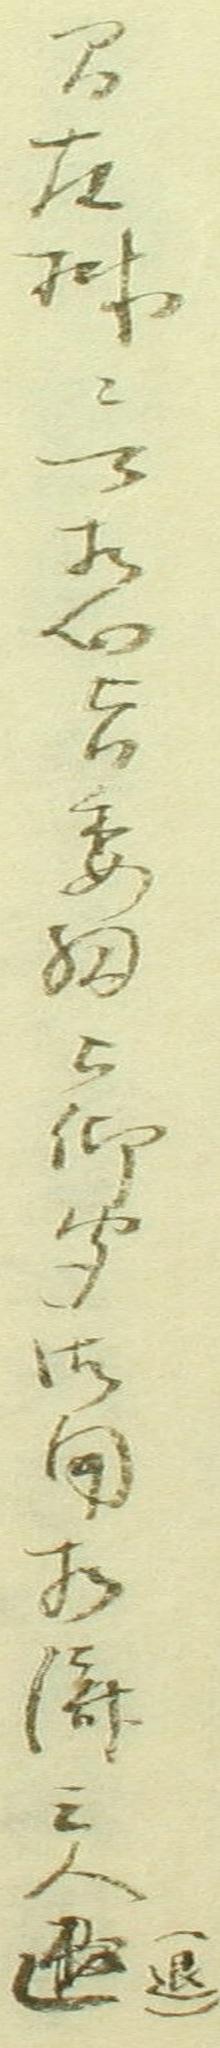間左様に可相心旨委細被仰聞御用相済三人？
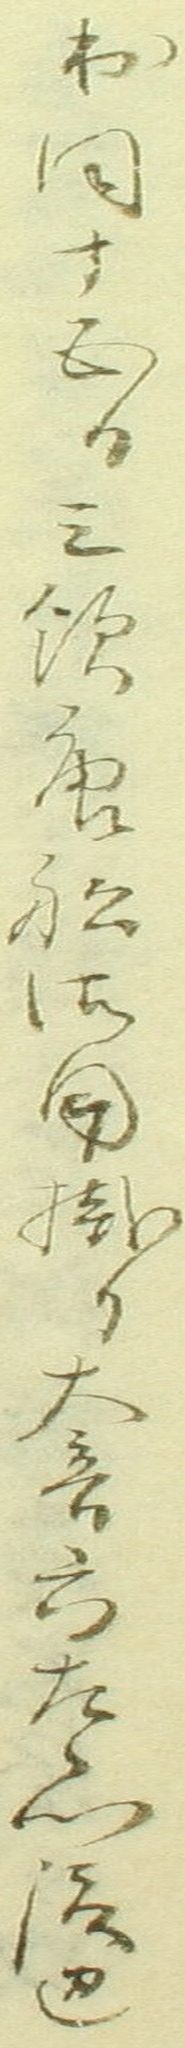出同十五日三領唐船御用掛りだ大音六左衛門渡辺
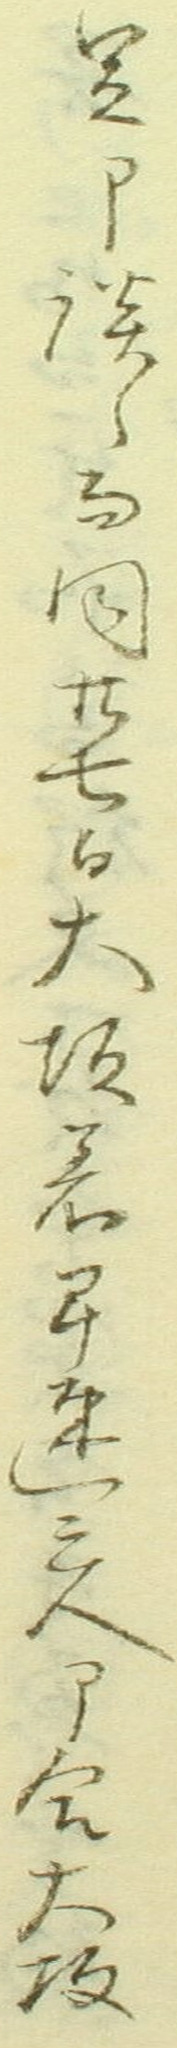足申談候而同廿七日大坂着早速三人申合大坂
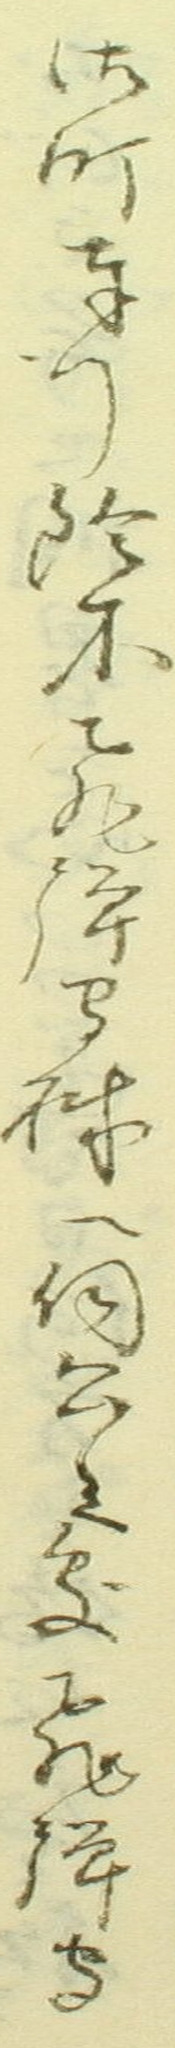御町奉行鈴木飛弾守様へ伺公之處飛騨守
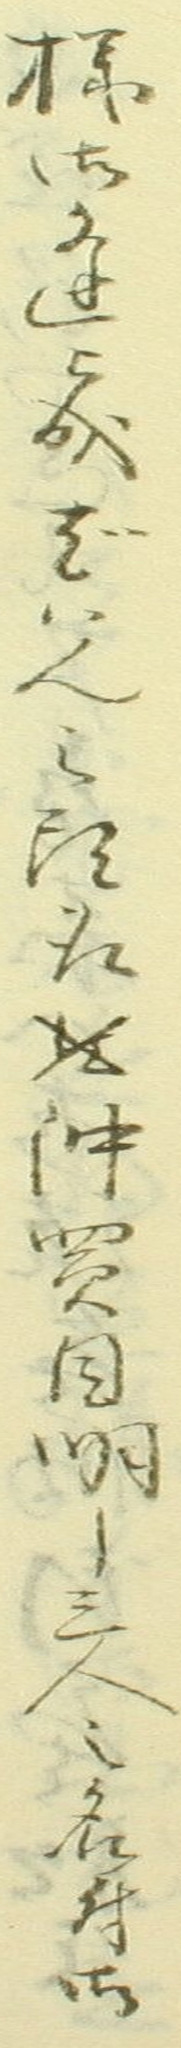様御逢被成ばいん之頭取？沖買目明し三人之名付御
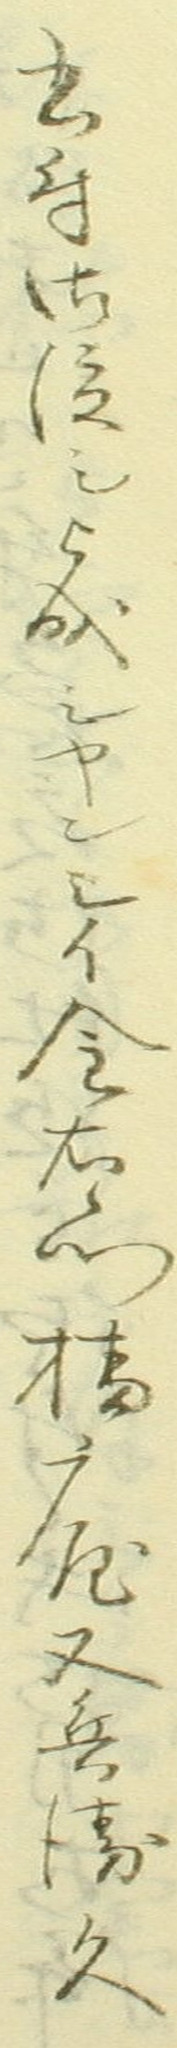出付御？し被成しやんしい金右衛門橋戸屋又兵衛久
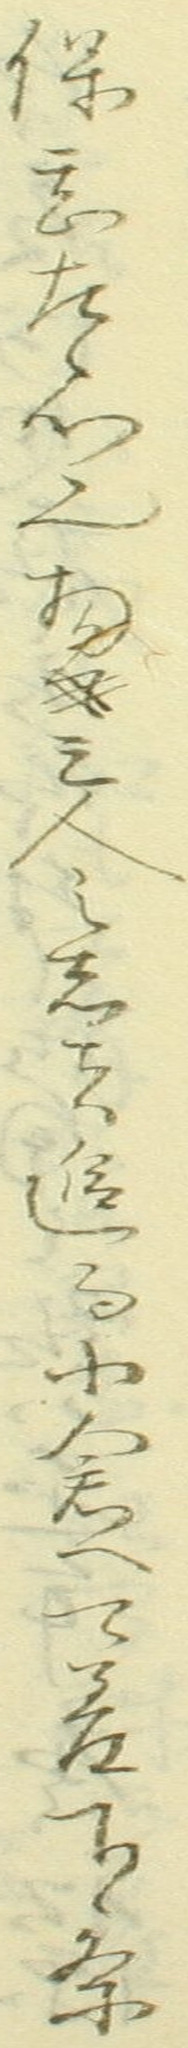保甚左衛門之物？三人之志者追而小倉へて差下候条
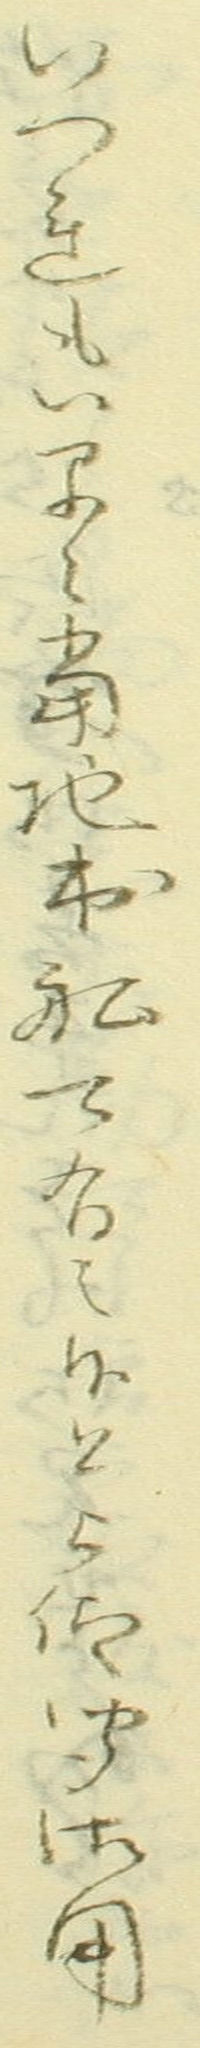いつれもい早々当地本船可有之候と被仰聞御用
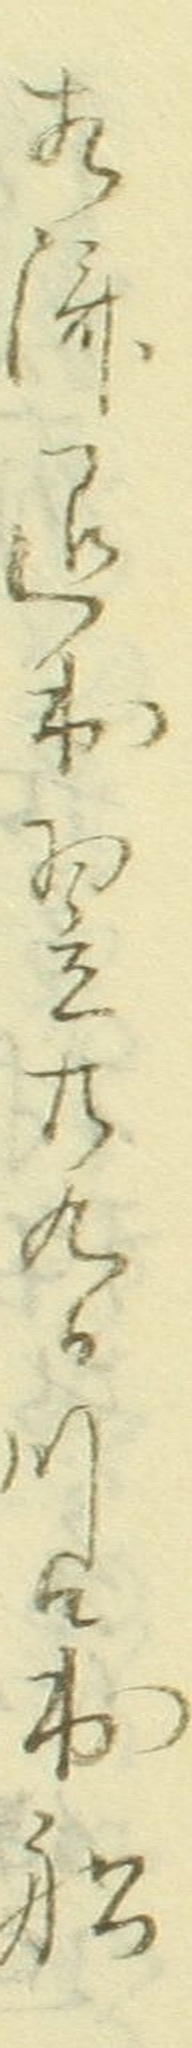合済退出翌廿九日川ゟ出船
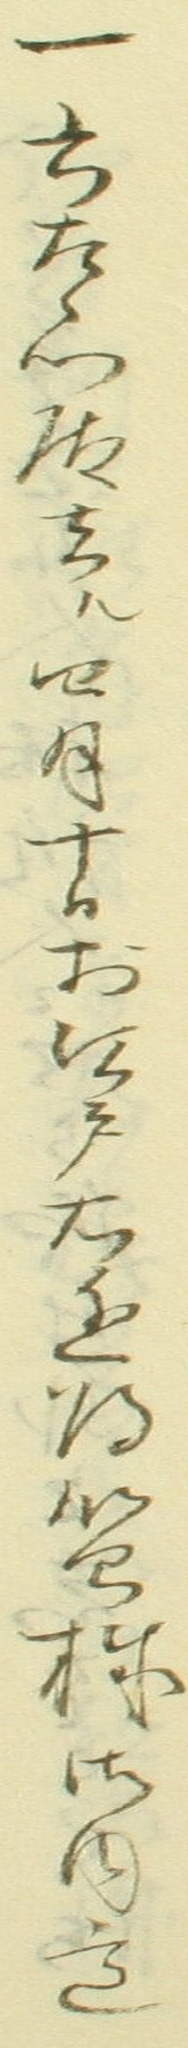一六左衛門殿去る四月十日お江戸右近将監様御内迠
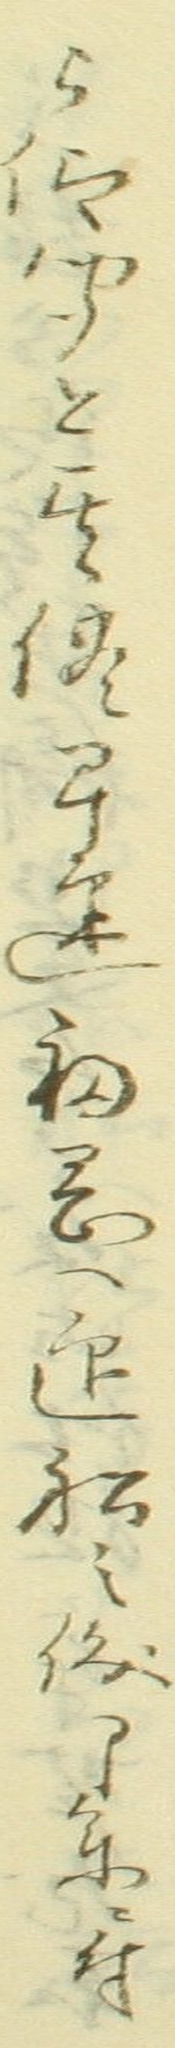被仰聞と其侭早速福岡ヘ追船之儀申来に付
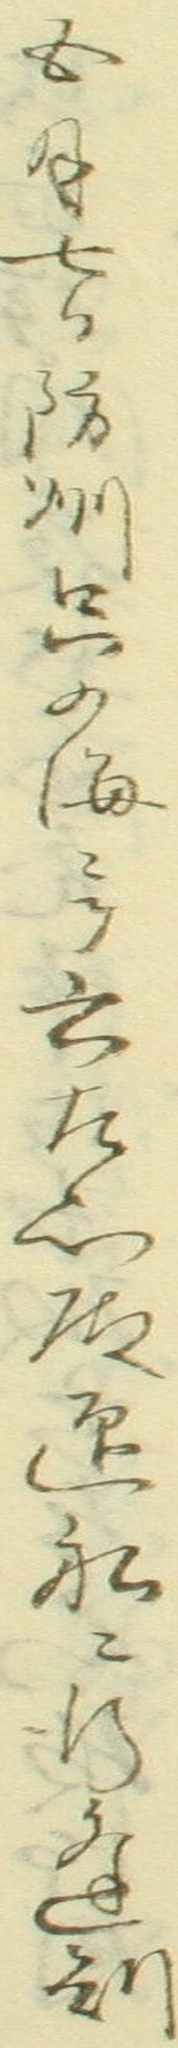五月七日防州只の海に而六左衛門殿追船に行逢則
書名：唐船漂流記 四
